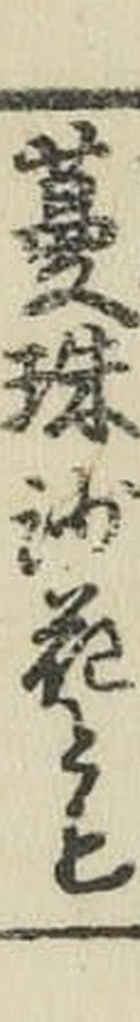蔓殊沙花とも
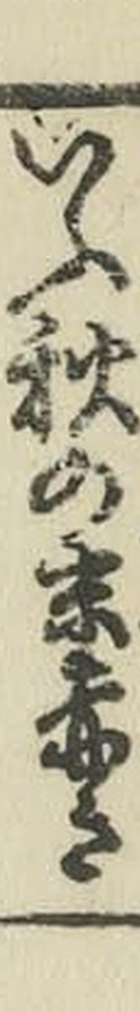いふ秋の末赤き
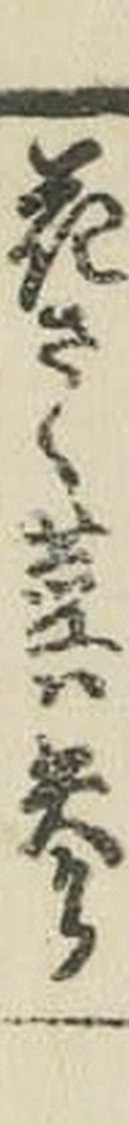花さく茎は矢から
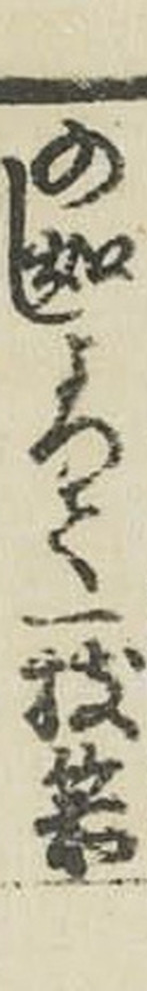の如しよつて一枝箭
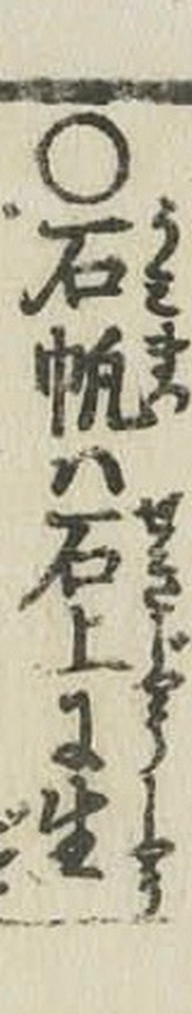○石帆は石上に生ず
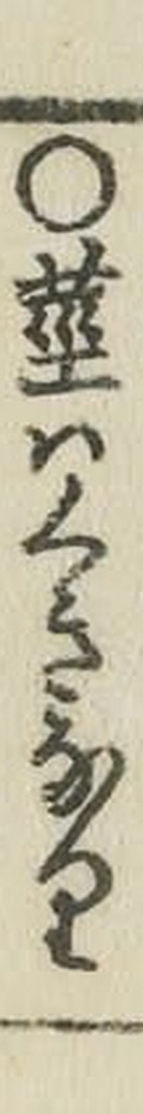○茎はくきなり
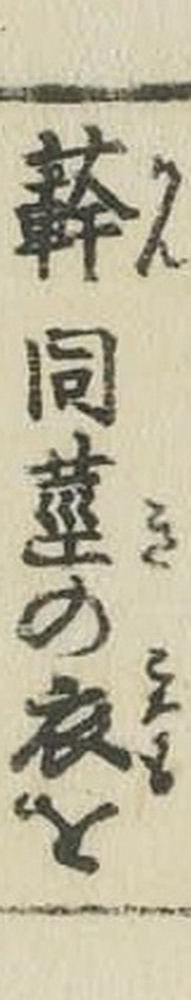𦼮同茎の衣を
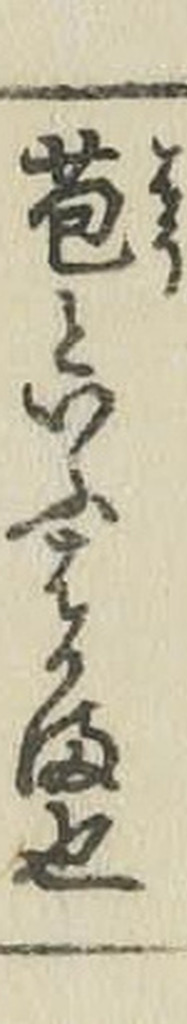苞といふはかま也
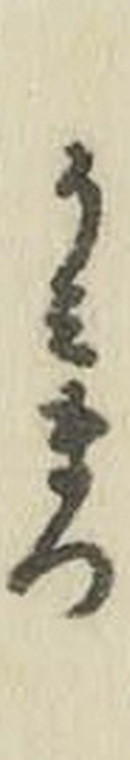うみまつ
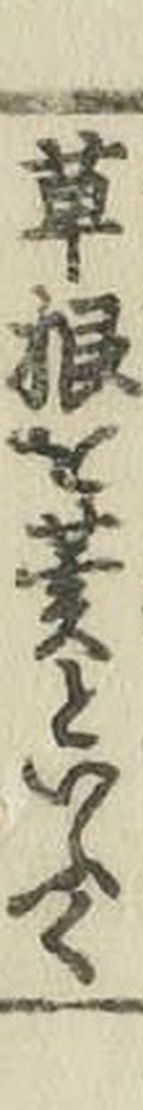草根を荄といふく
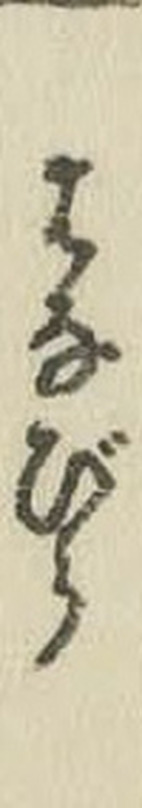はなびら
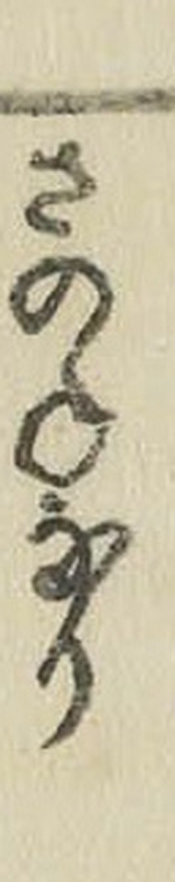さのねなり
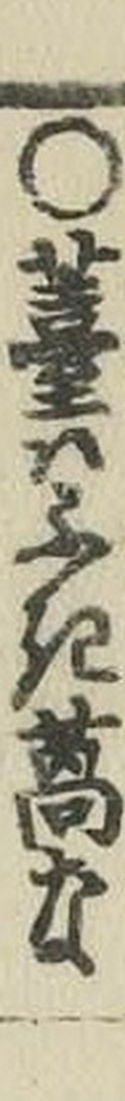○薹はふき萵な
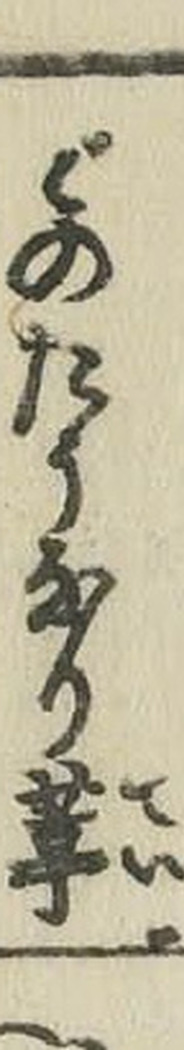どのたうなり葶
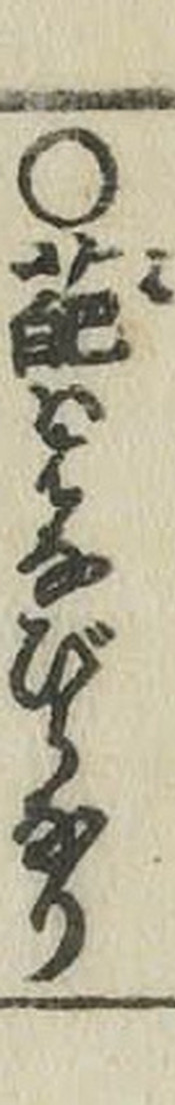○葩ははなびらなり
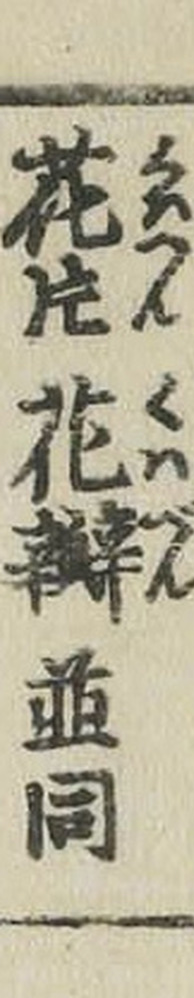花片花弁並同
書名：増補頭書訓蒙図彙大成 10巻 9:巻之20
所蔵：東京学芸大学教育コンテンツアーカイブ
